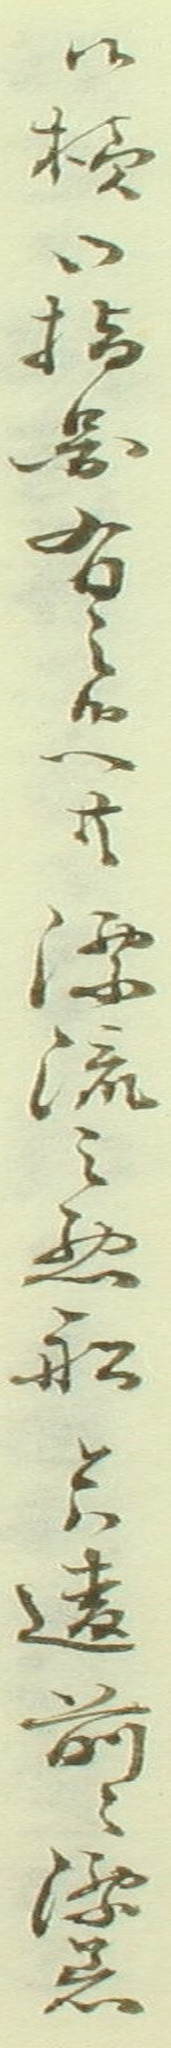候様御指図有之候へ共漂着之悪船とは違前々漂着
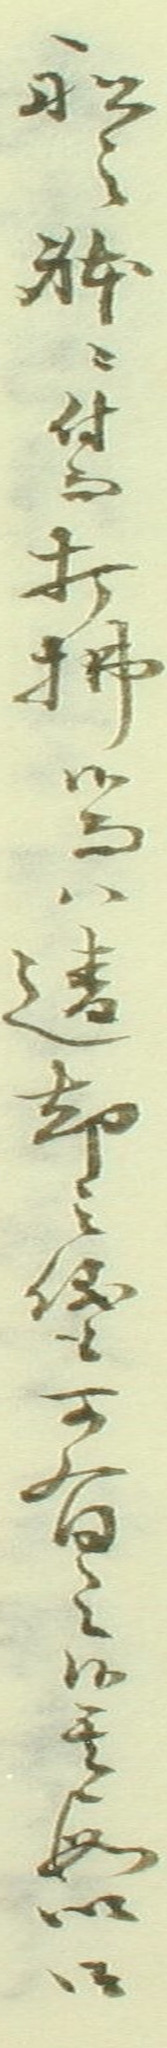船之躰に付而打払候而は違却之儀も可有之候其段以御
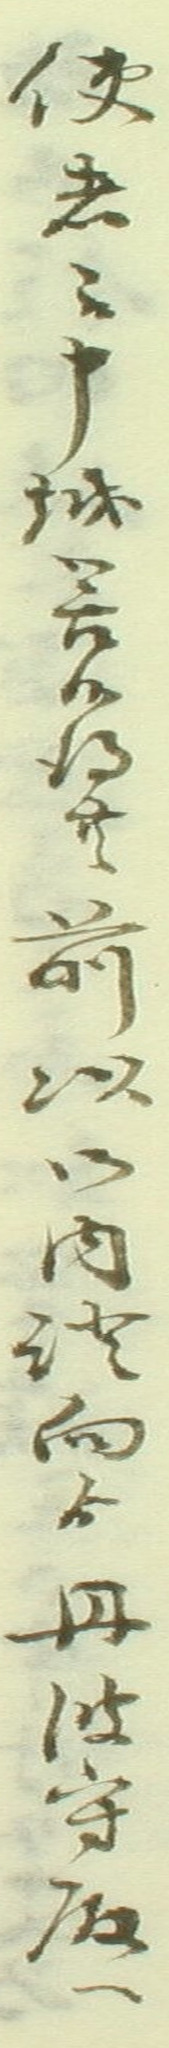使者被申越筈候得共前以御内証向ゟ丹波守殿へ
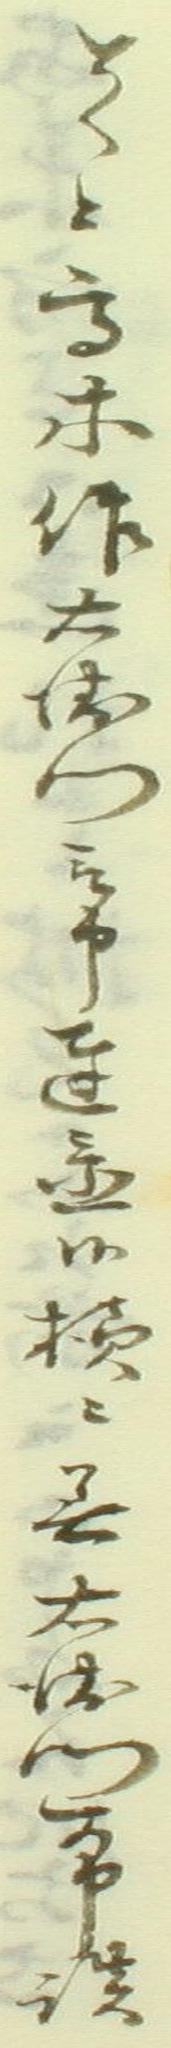とくと高木作右衛門被申達置候様に善右衛門可申談
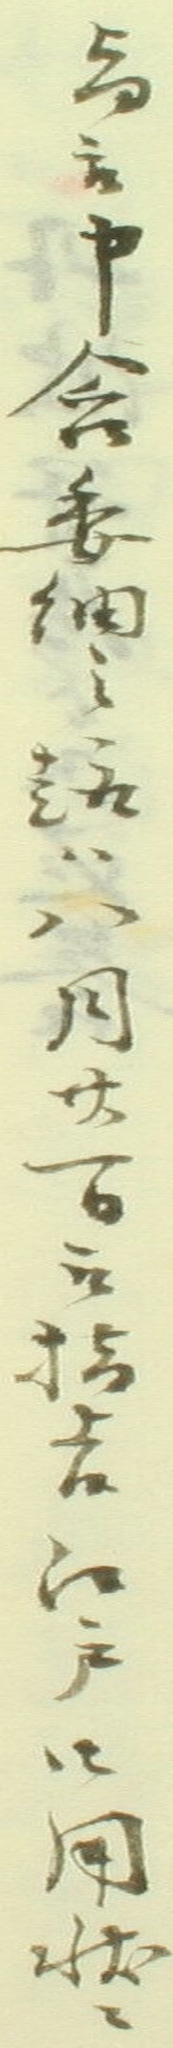旨被申含委細之趣は八月廿一日被指上候江戸御用状に
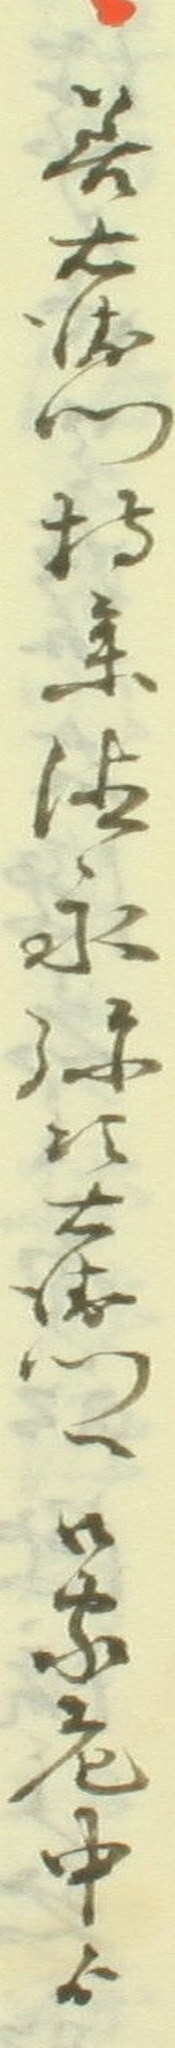善右衛門持参徳永弥次右衛門へ御家老中ゟ
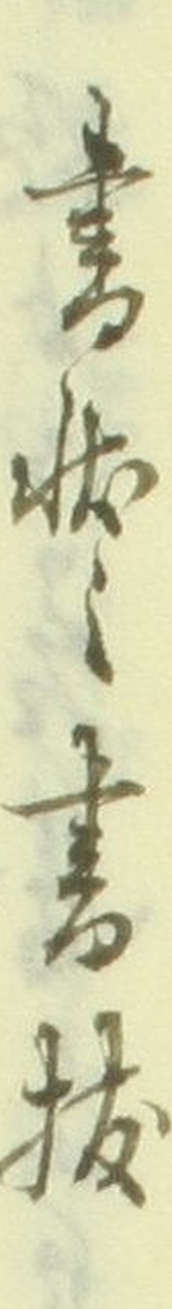書状之書抜
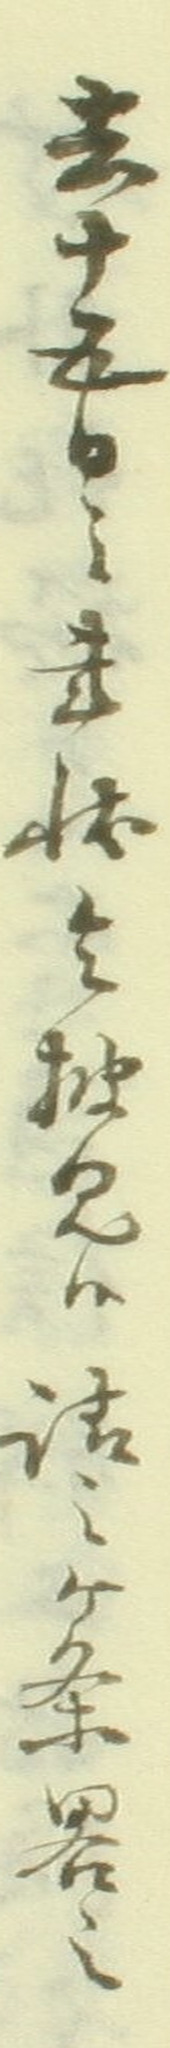去一五日之書状令被見候請之ヶ条略之
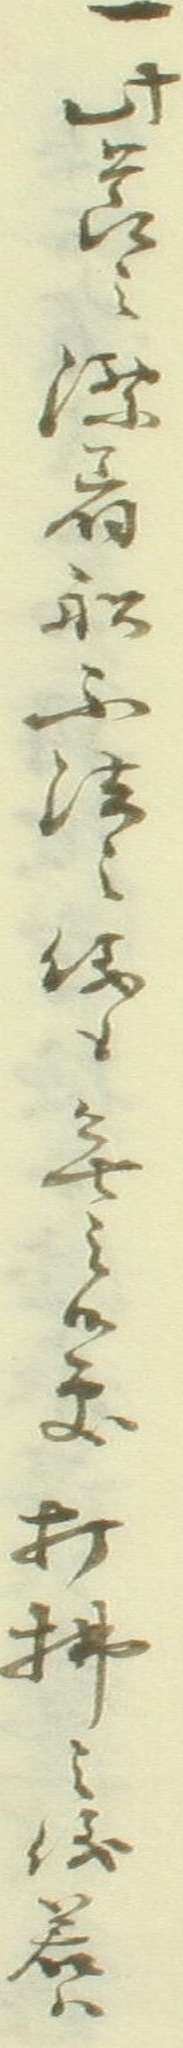一此節之漂着船不法之儀も無之候処打払之儀若は
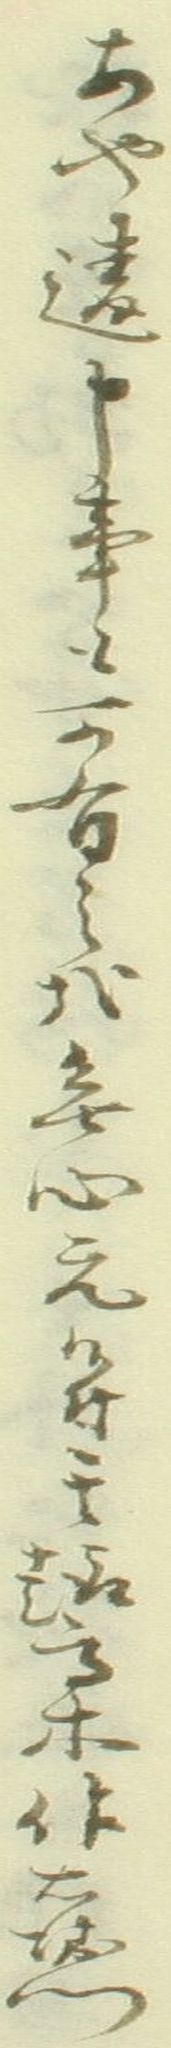あや違申事も可有之哉無心元候付其趣高木作右衛門
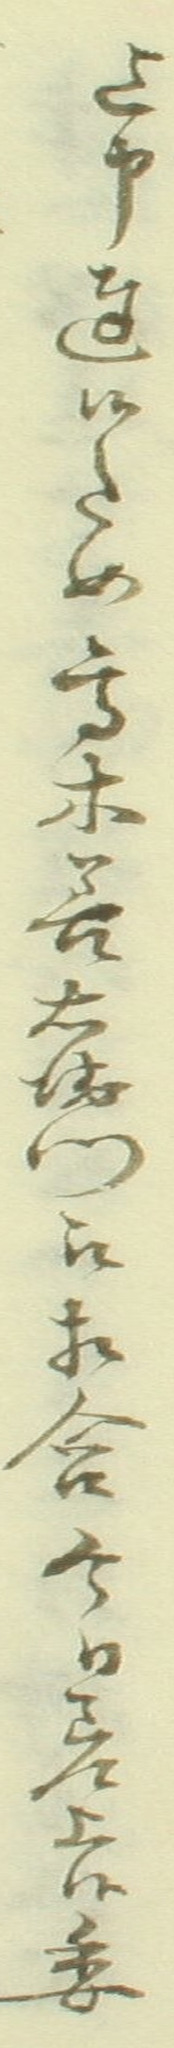迄申達候ため高木善右衛門え相含今日差上候委
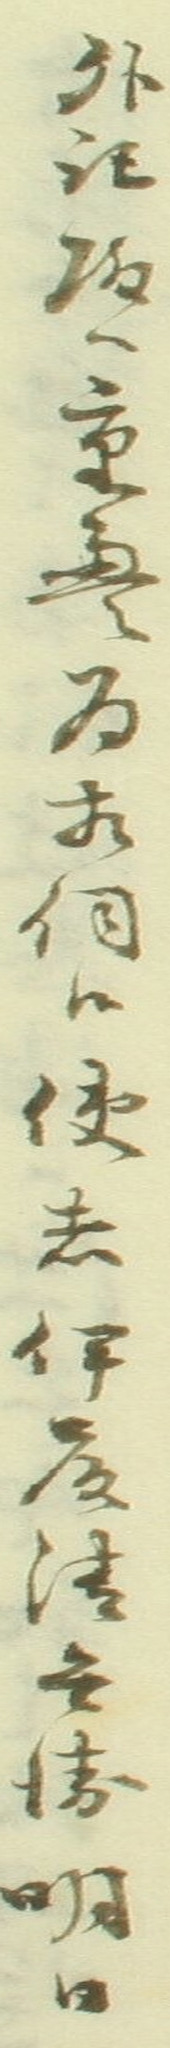外記殿へ重畳為相伺候使者伊藤清兵衛明日
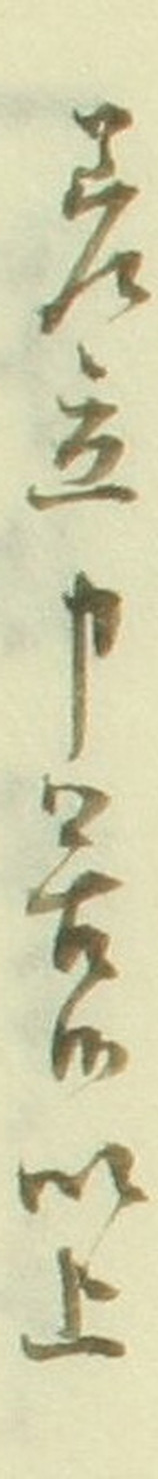差立申筈候以上
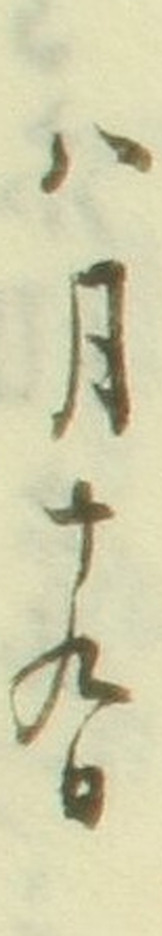八月十九日

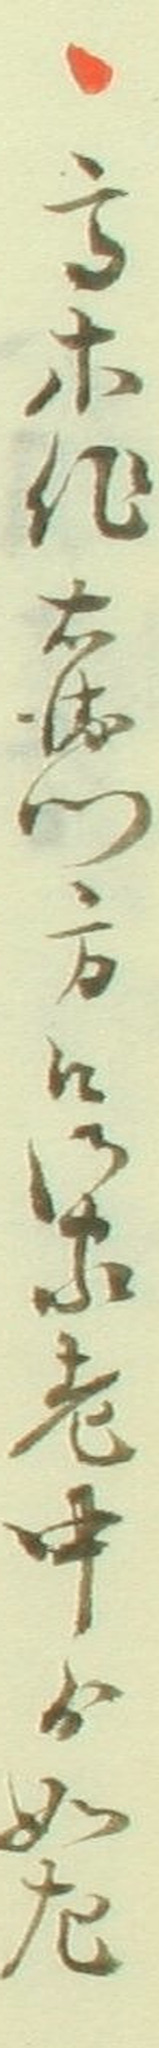高木作右衛門方え御家老中ゟ如左
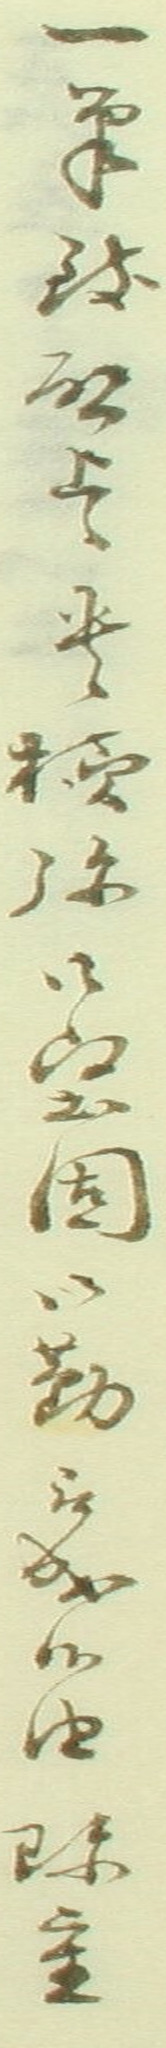一筆致啓上候貴様弥御堅固御勤被成候由珍重
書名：異国船漂着記
